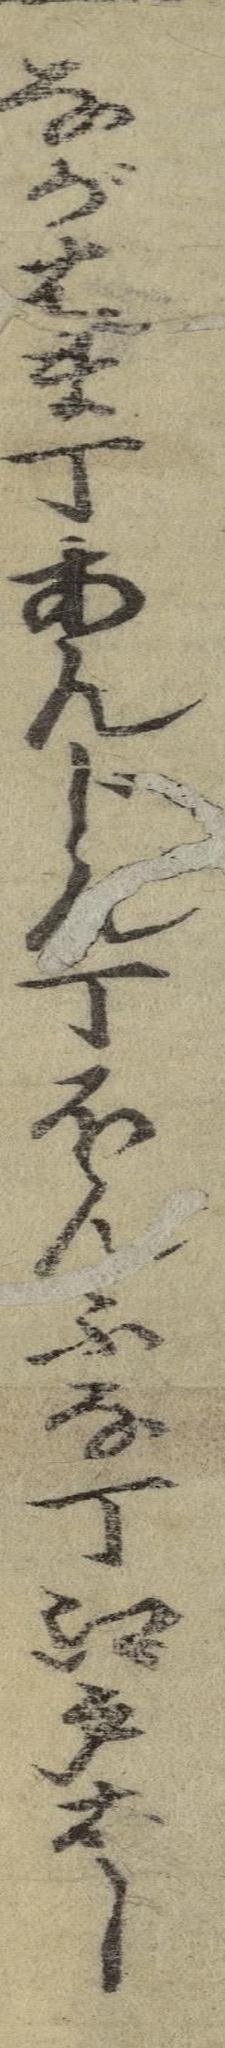ながはま丁あんじん丁ほんふな丁江戸はし
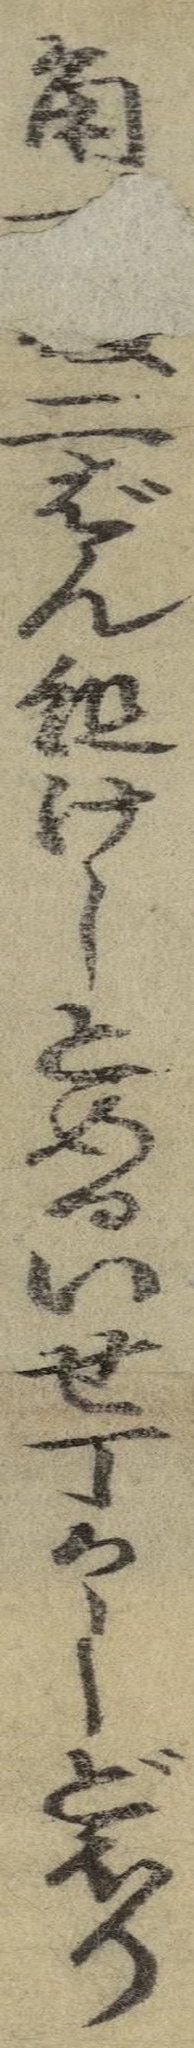角一番ニばん組けしとめるいせ丁かしどほり
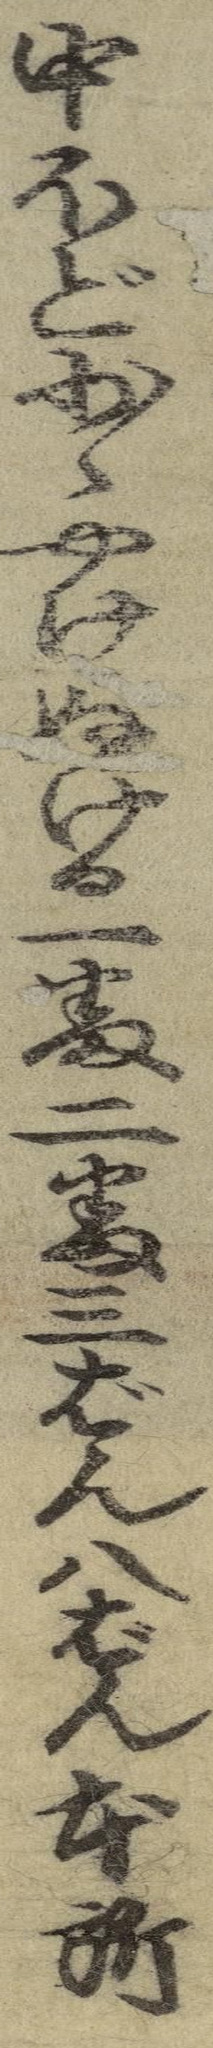中ほど少ゝやけぬける一番二番三ばん八ばん本所
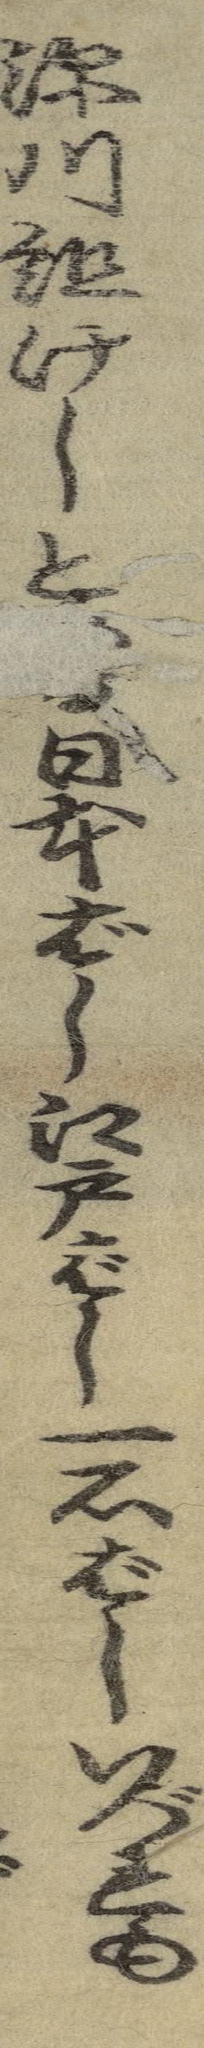深川組けしとめる日本ばし江戸ばし一石ばしいづれも
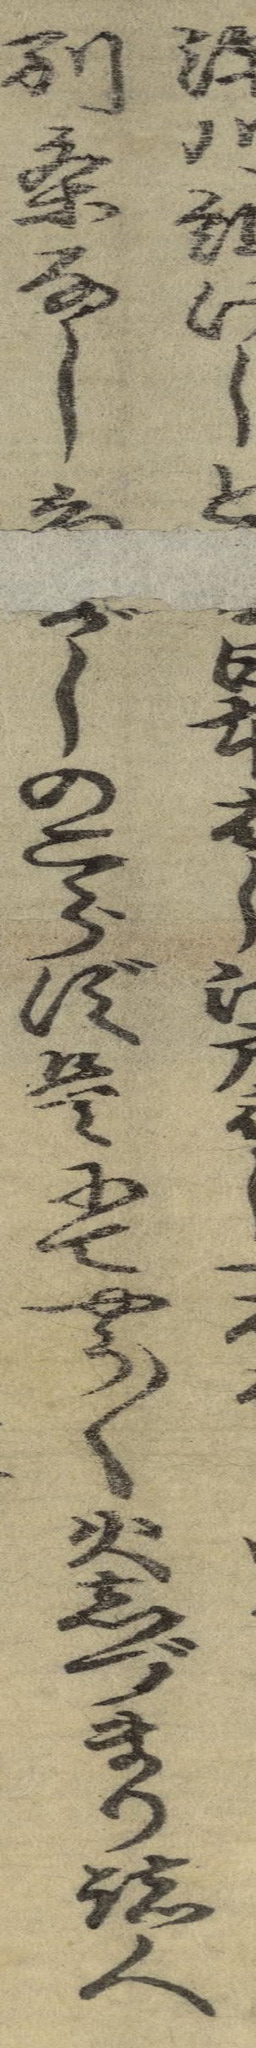別条なし魚がしのこらず是にてやう〳〵火しづまり諸人
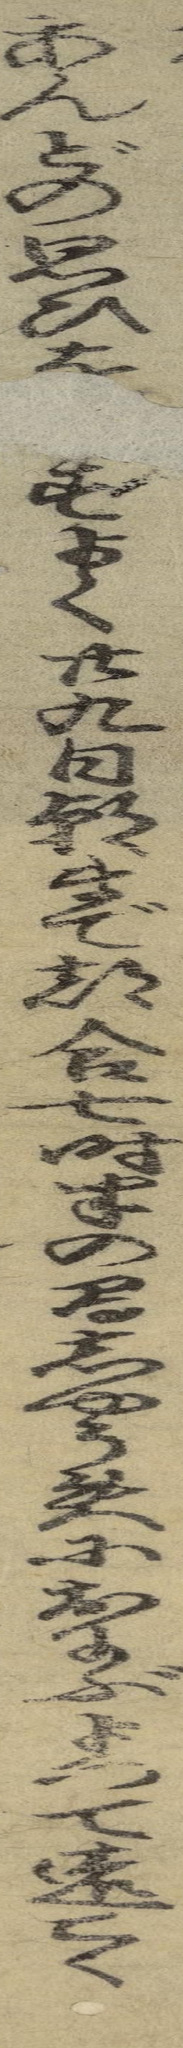あんどの思ひをなすよく廿九日朝まで都合七時半の間しやう失におよぶよつて遠く
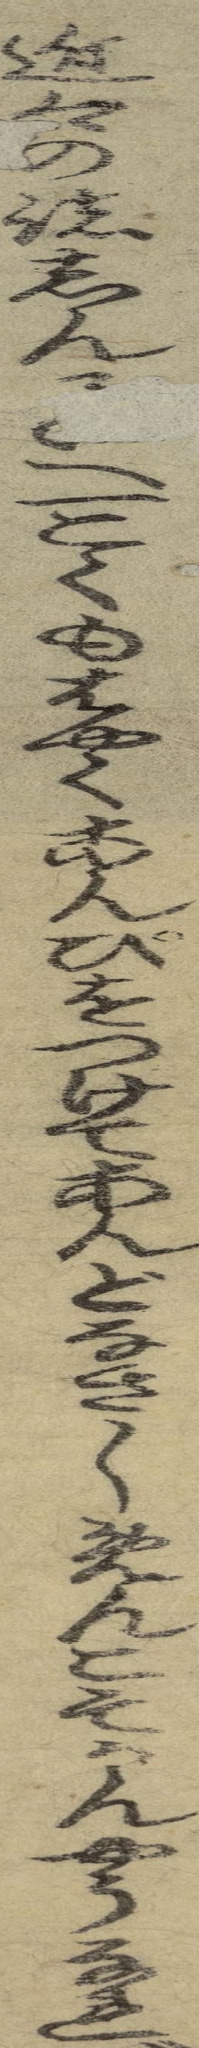近郷の諸しんるいへ一こくもはやくあんぴをつけてあんどなさしめんこそかんやうなれば
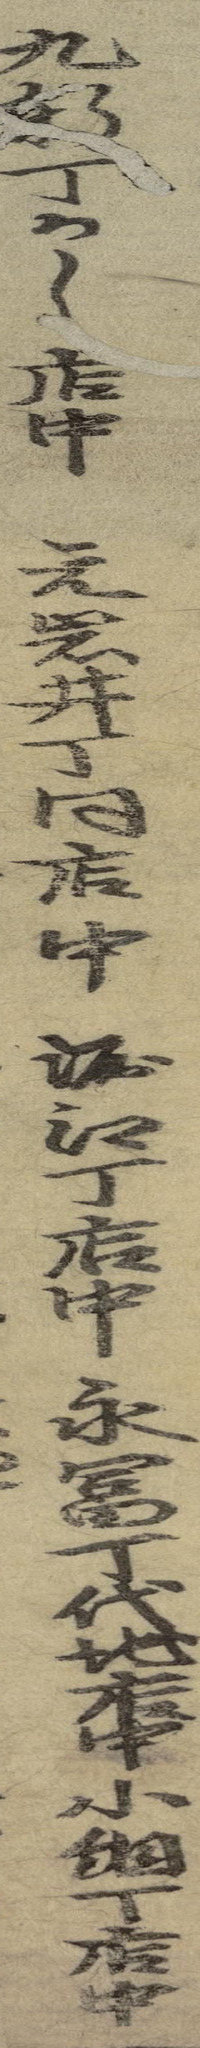九軒丁かし店中元岩井丁同店中堀江丁店中永富丁代地店中小銅丁店中
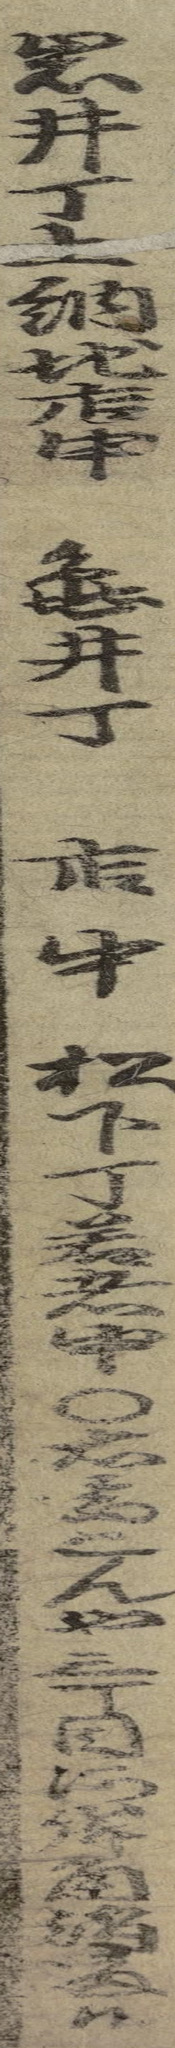岩井丁上納地店中亀井丁店中松下丁若者中〇右島こんや三丁目河岸角消留候
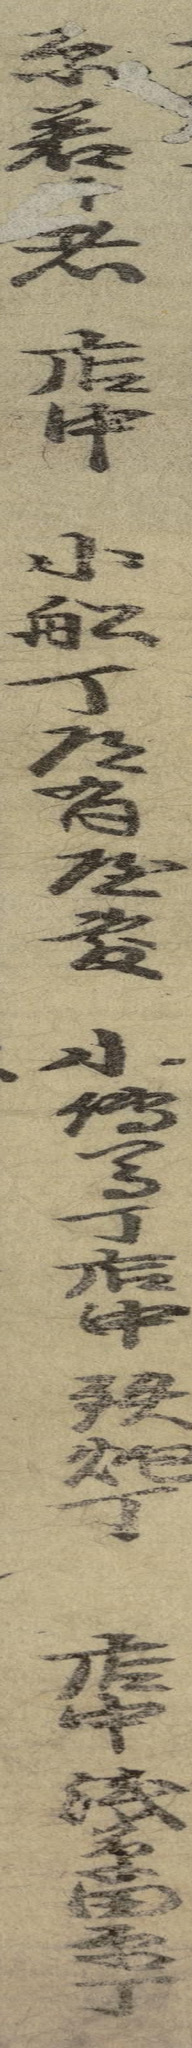京若し者店中小舩丁道有屋敷小伝馬町店中鉄炮丁店中浅草田原丁
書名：[安政元年十二月の江戸大火に関する瓦版]
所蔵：東京大学地震研究所図書室 Earthquake Research Institute Library, The University of Tokyo, JAPAN
